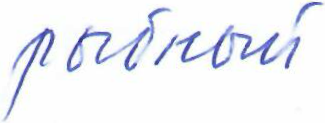рыбный
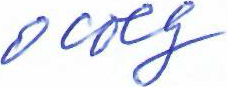осоед
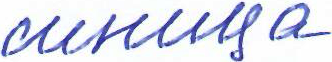синица
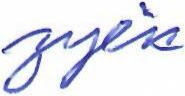зуёк
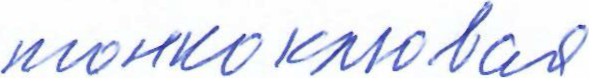тонкоклювая
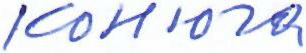конюга
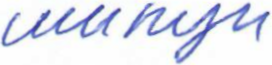шипун
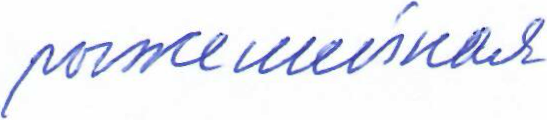рыжешейная
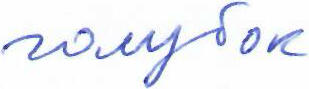голубок
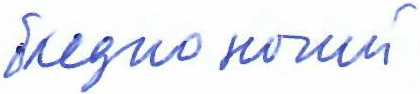бледно ногий
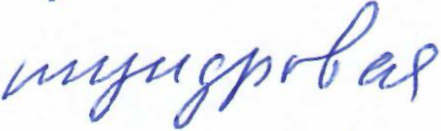тундровая
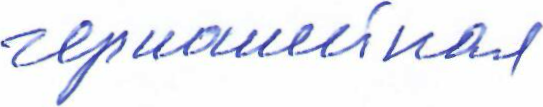черношейная
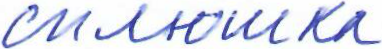сплюшка
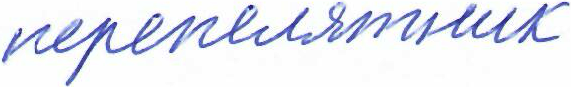перепелятник
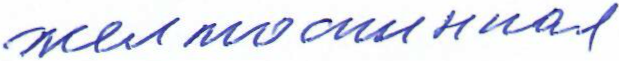желтоспинная
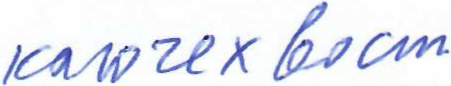калочехвост
